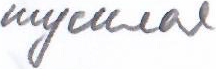тусклая
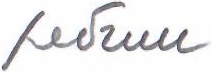рябчик
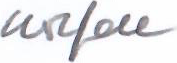нырок
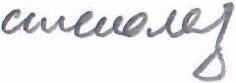стенолаз
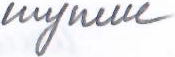тупик
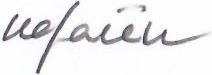королёк
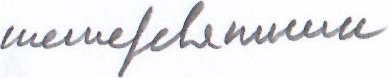тетеревятник
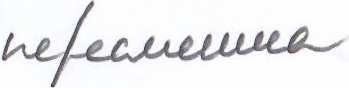пересмешка
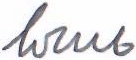выпь
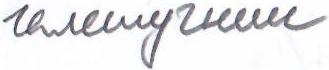галстучник
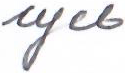гусь
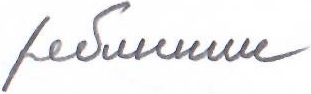рябинник
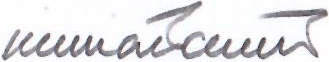китайский
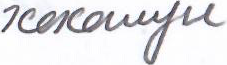хохотун
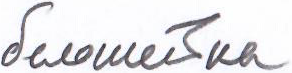белошейка
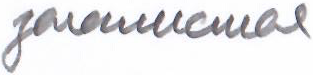золотистая
